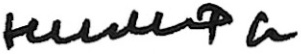нимфа
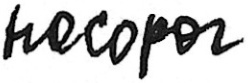носорог
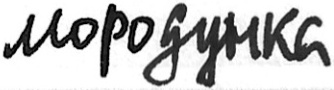мородунка
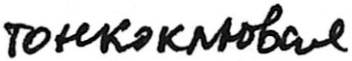тонкоклювая
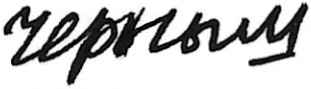черныш
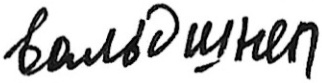вальдшнеп
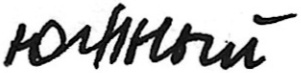южный
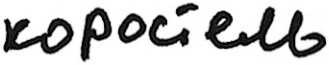коростель
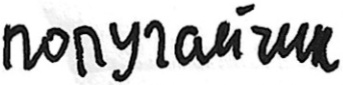попугайчик
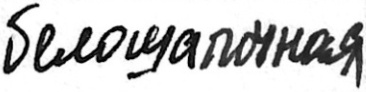белошапочная
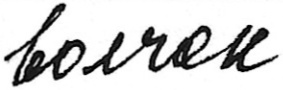волчек
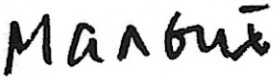малый
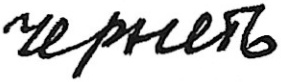чернеть
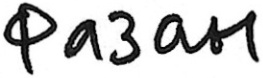фазан
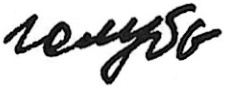голубь
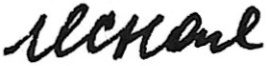лесная
